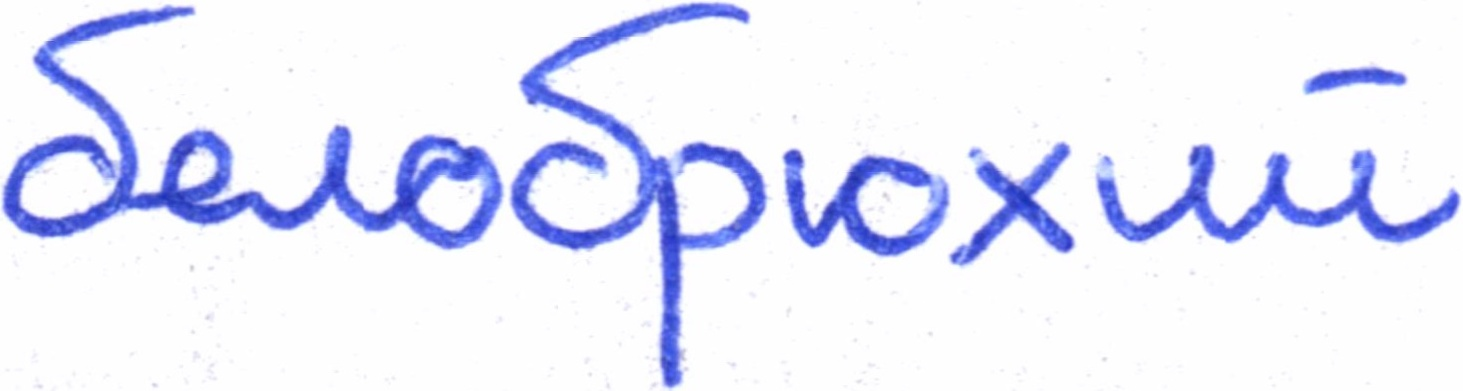белобрюхий
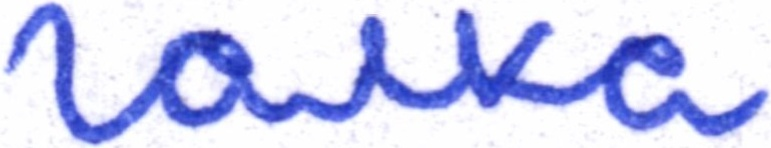галка
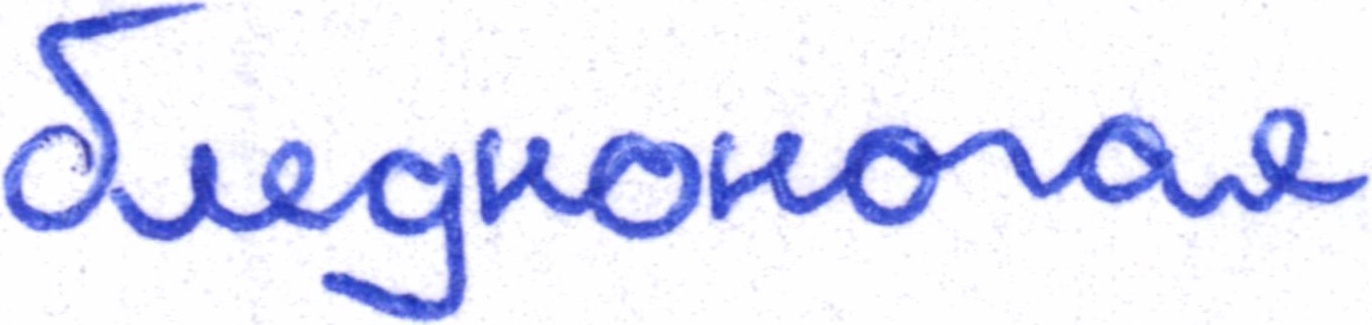бледноногая
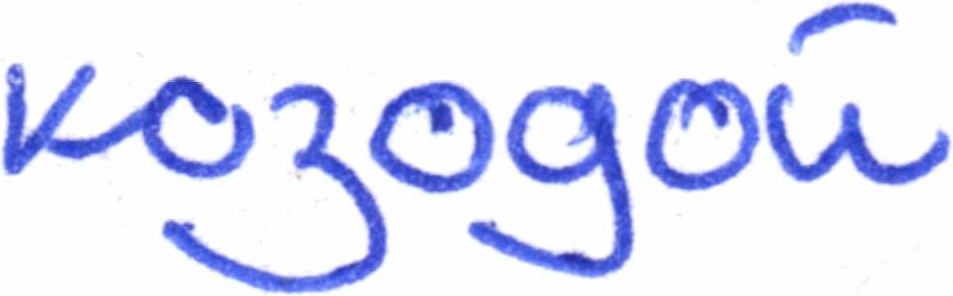козодой
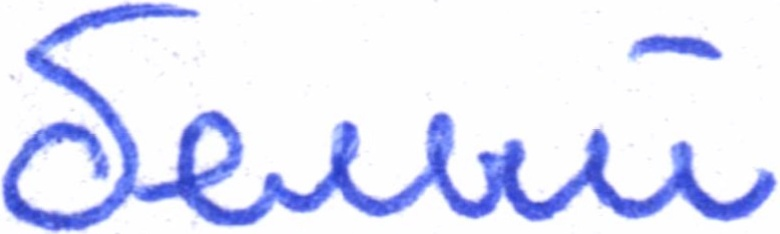белый
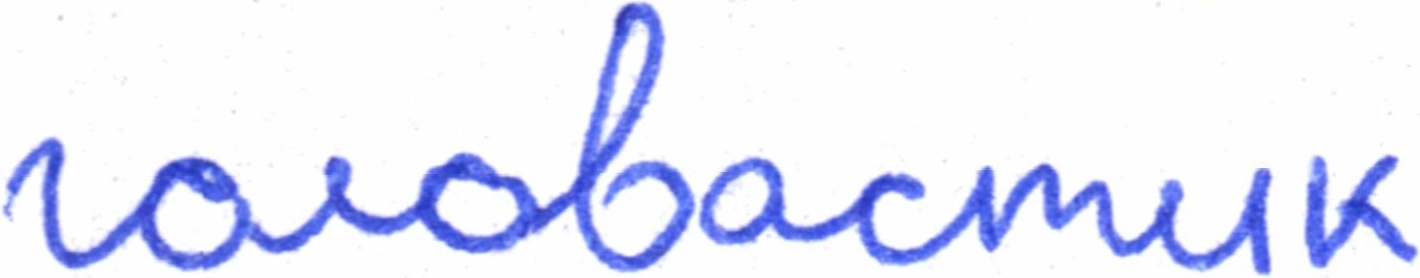головастик
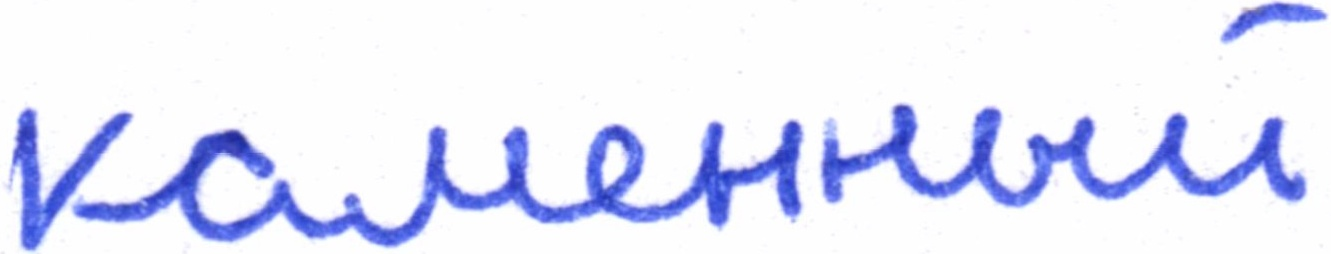каменный
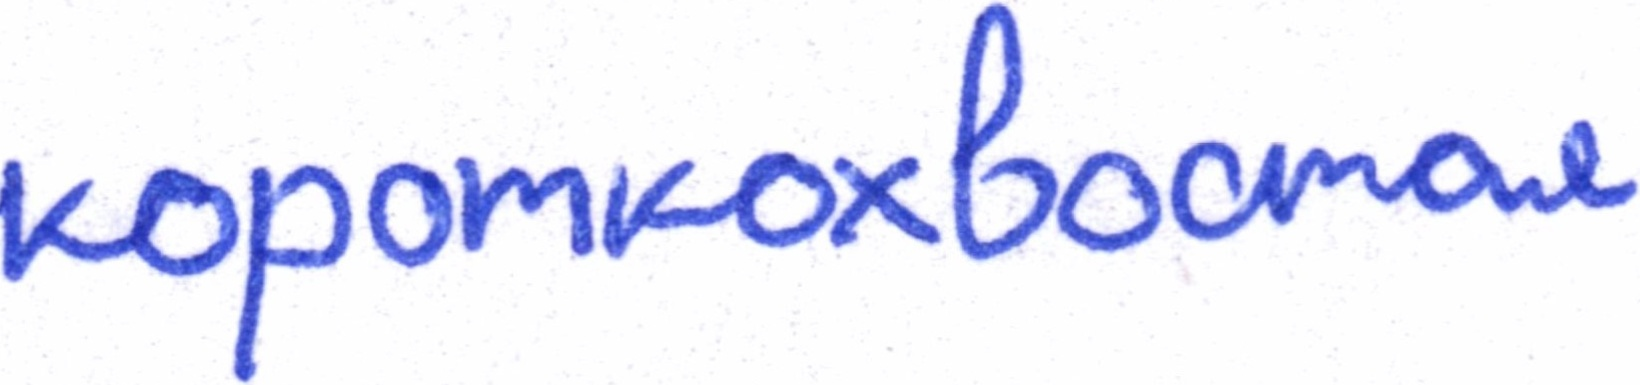короткохвостая
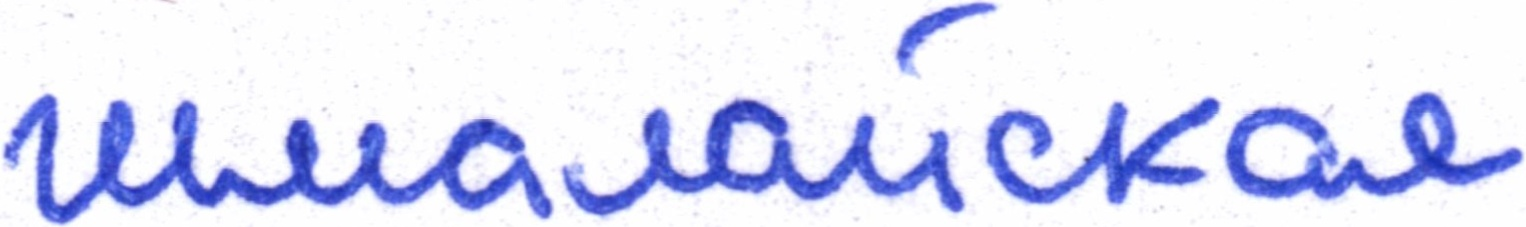гималайская
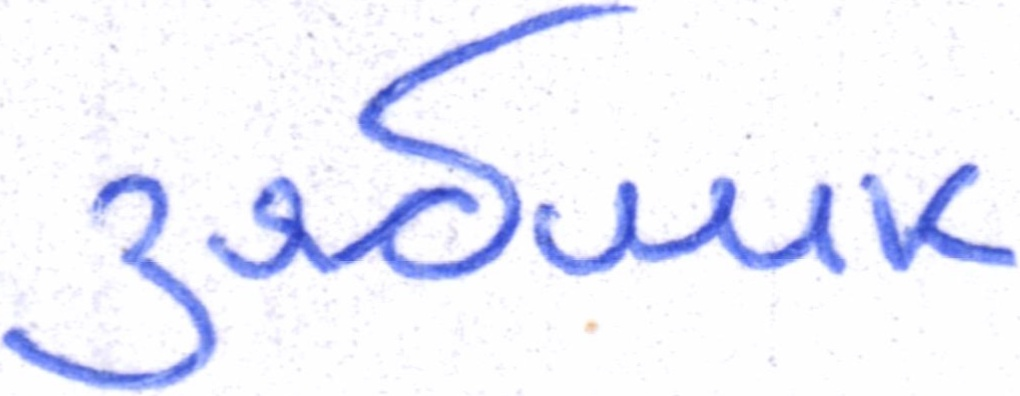зяблик
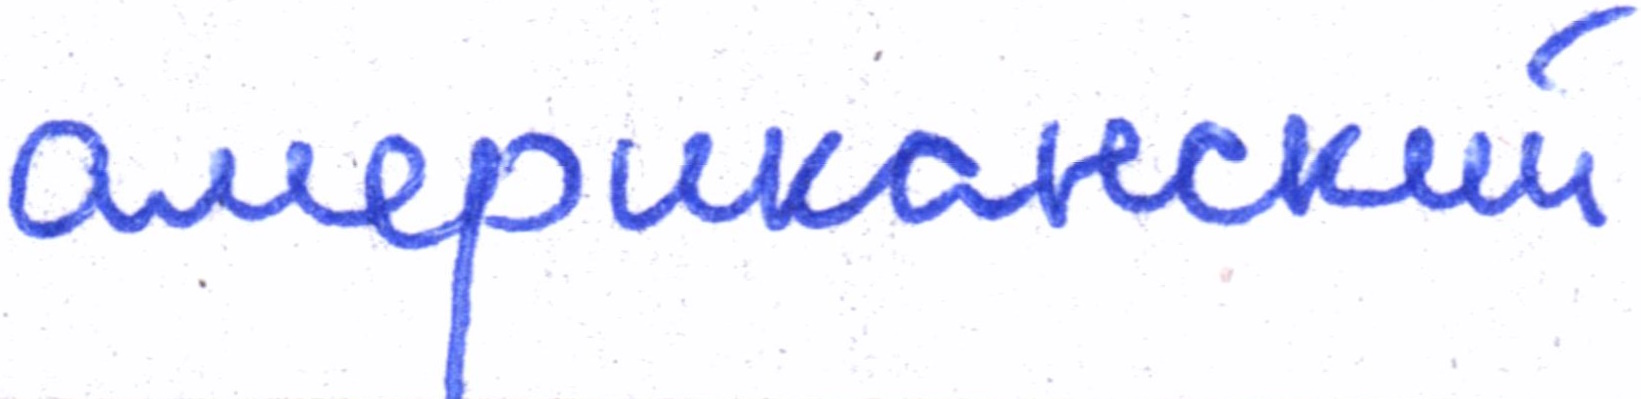американский
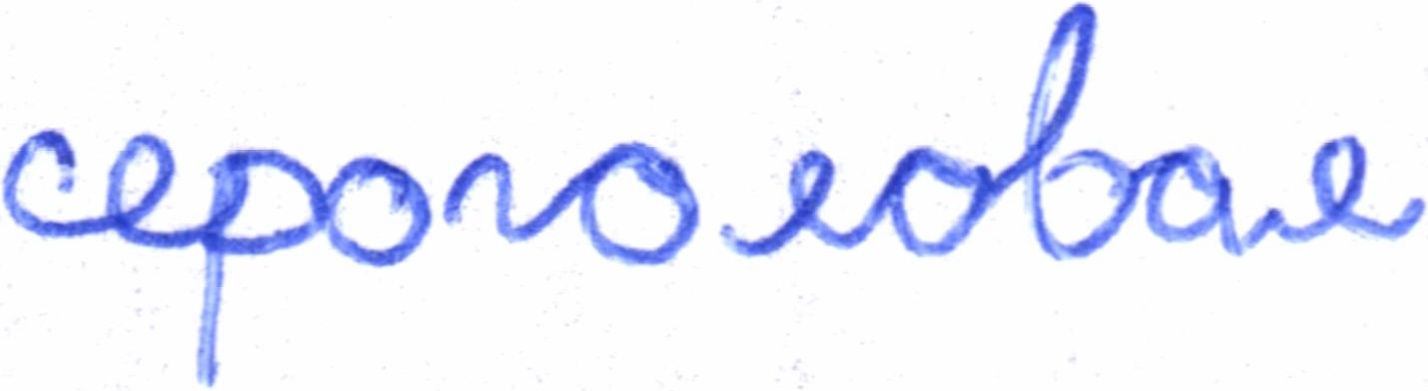сероголовая
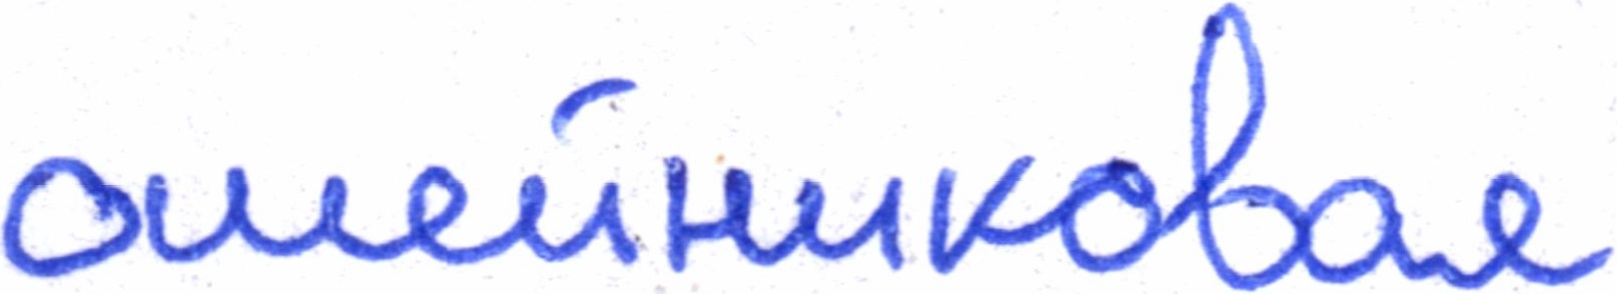ошейниковая
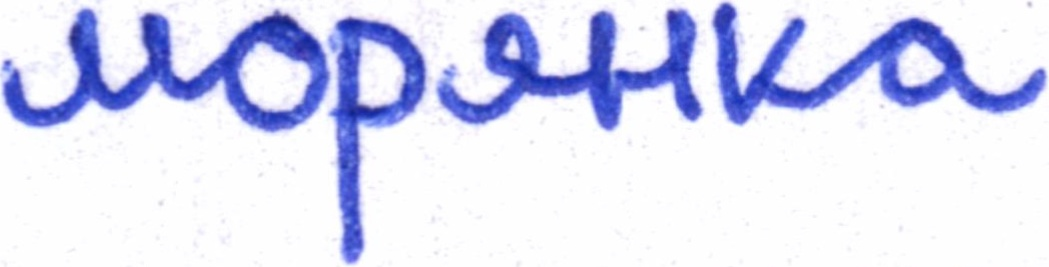морянка
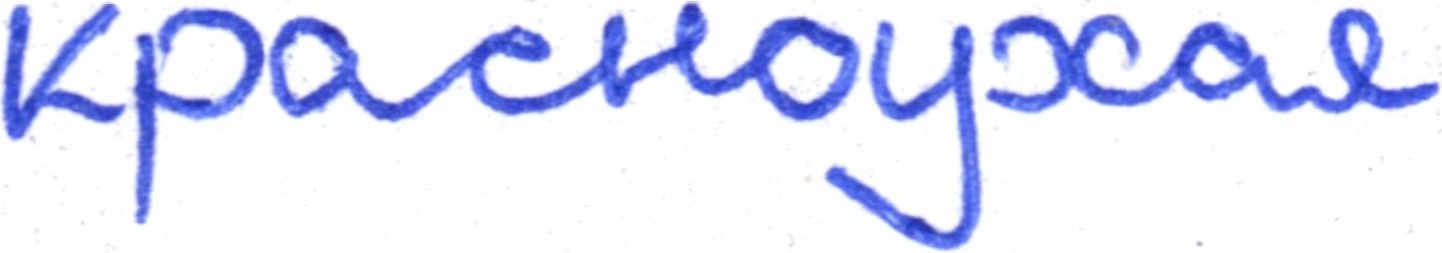красноухая
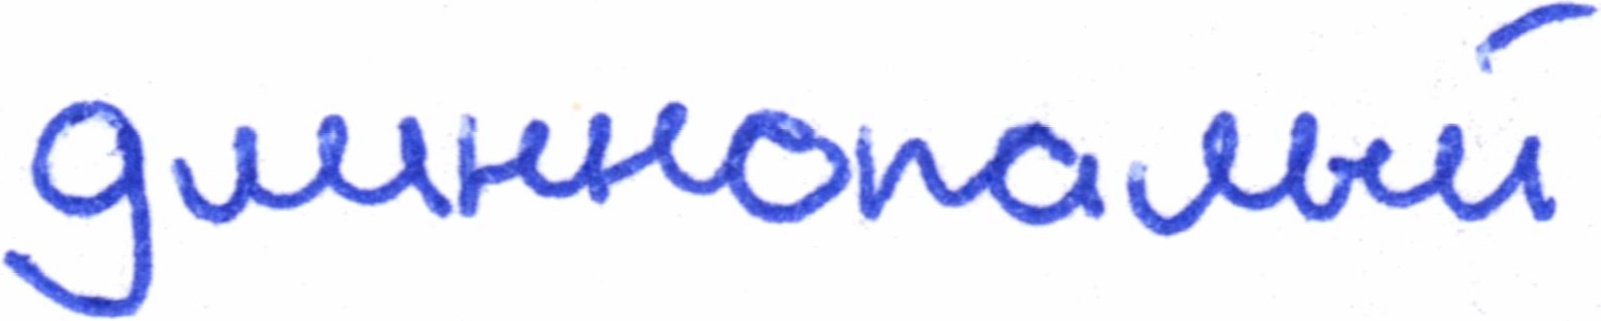длиннопалый
